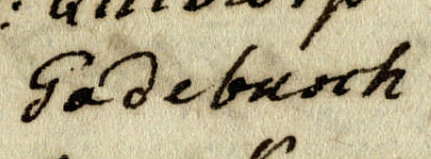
Gadebusch
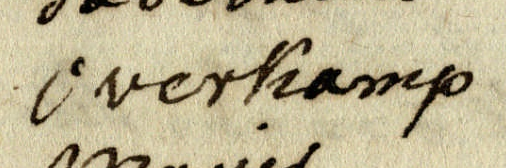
Overkamp
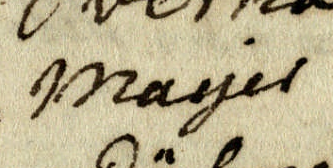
Maÿer
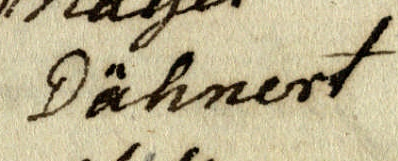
Dähnert
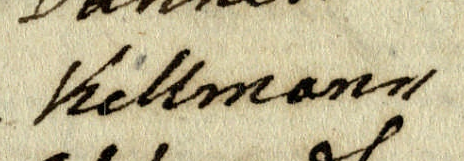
Kellmann
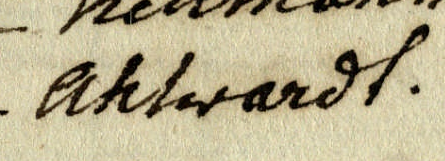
Ahlwardt.
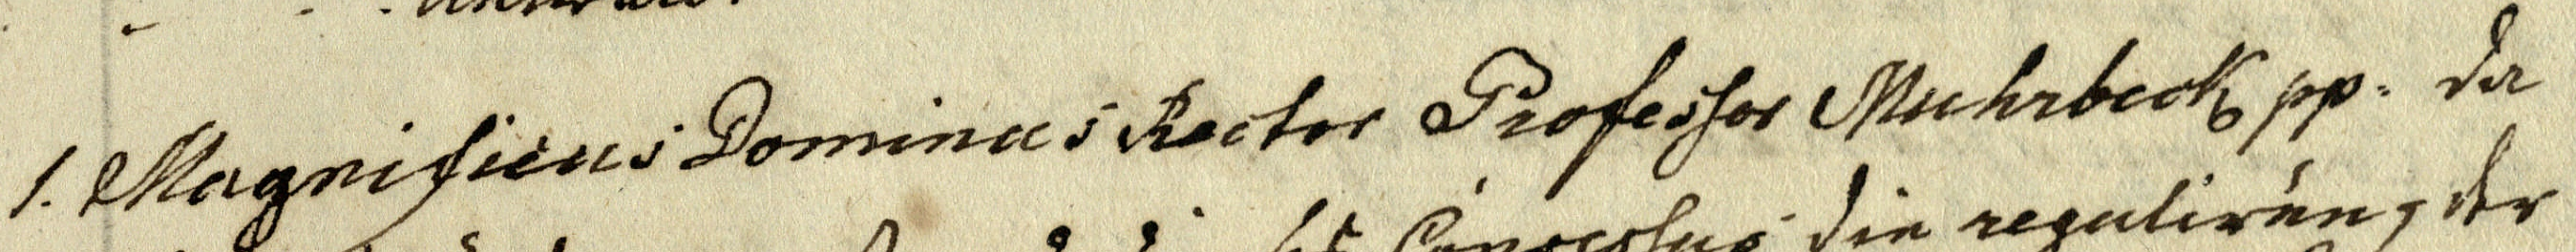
1. Magnificus Dominus Rector Professor Muhrbeck pp. da
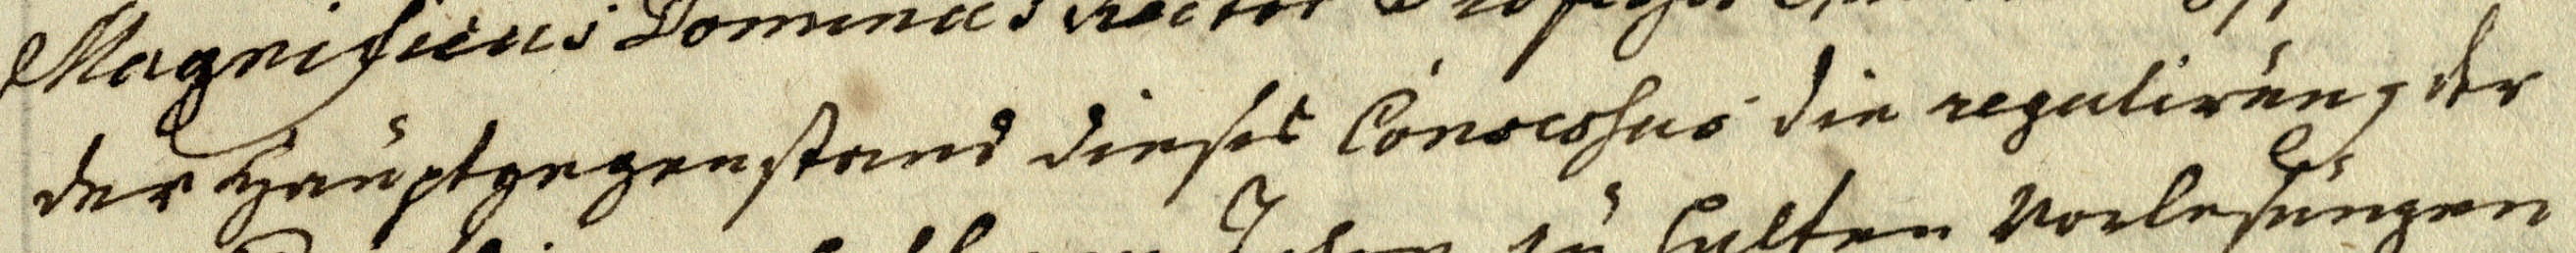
der Hauptgegenstand dieses Consessus die regulirung der
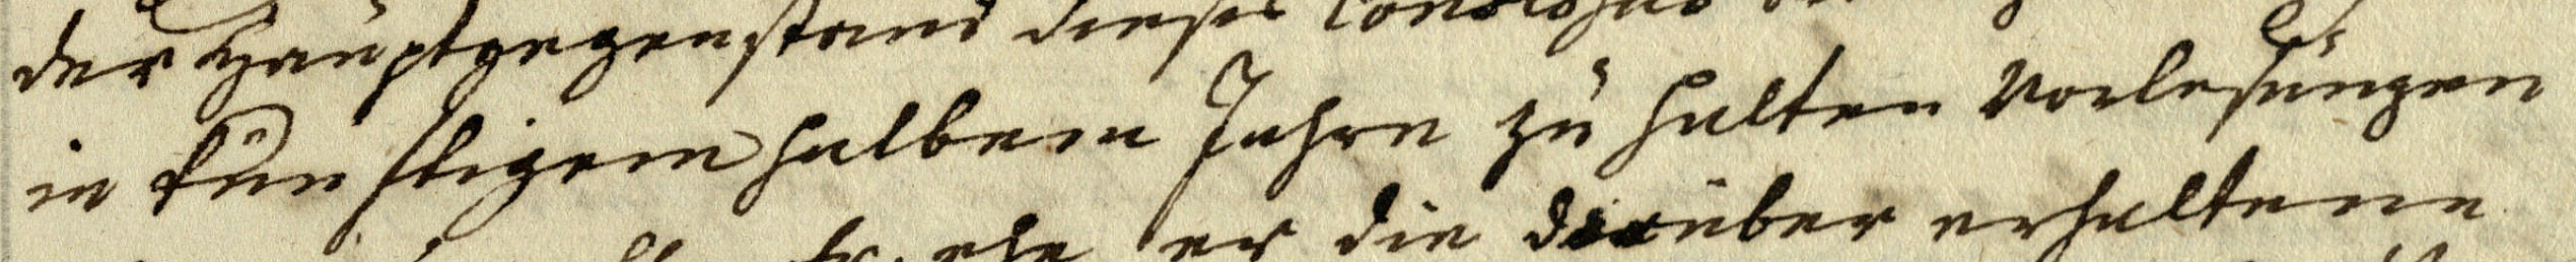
in künftigem halbem jahre zu halten Vorlesungen
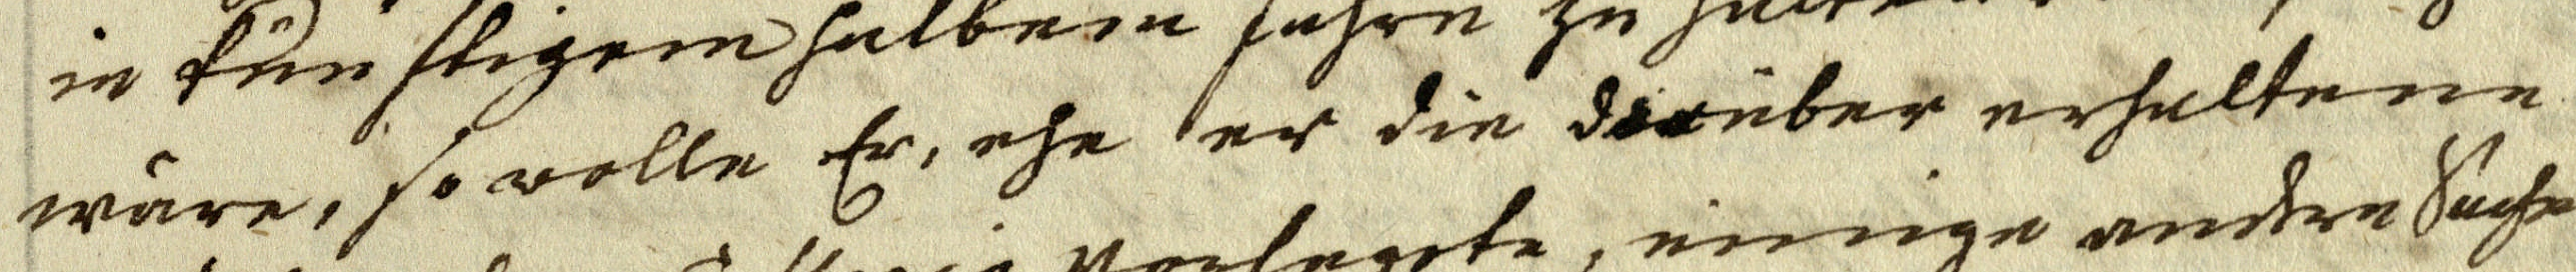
wäre, so wolle Er, ehe er die darüber erhaltene
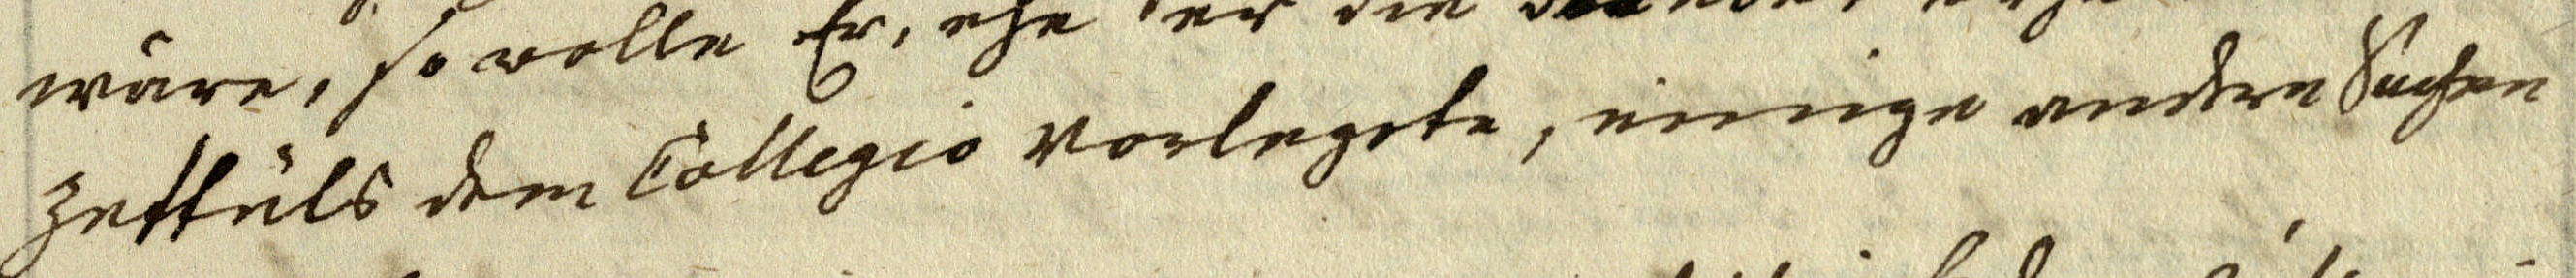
Zettuls dem Collegio vorlegete, einige andere Sachen
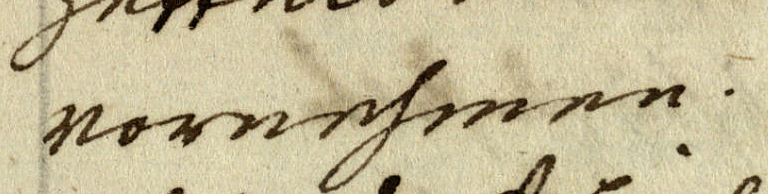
vornehmen.
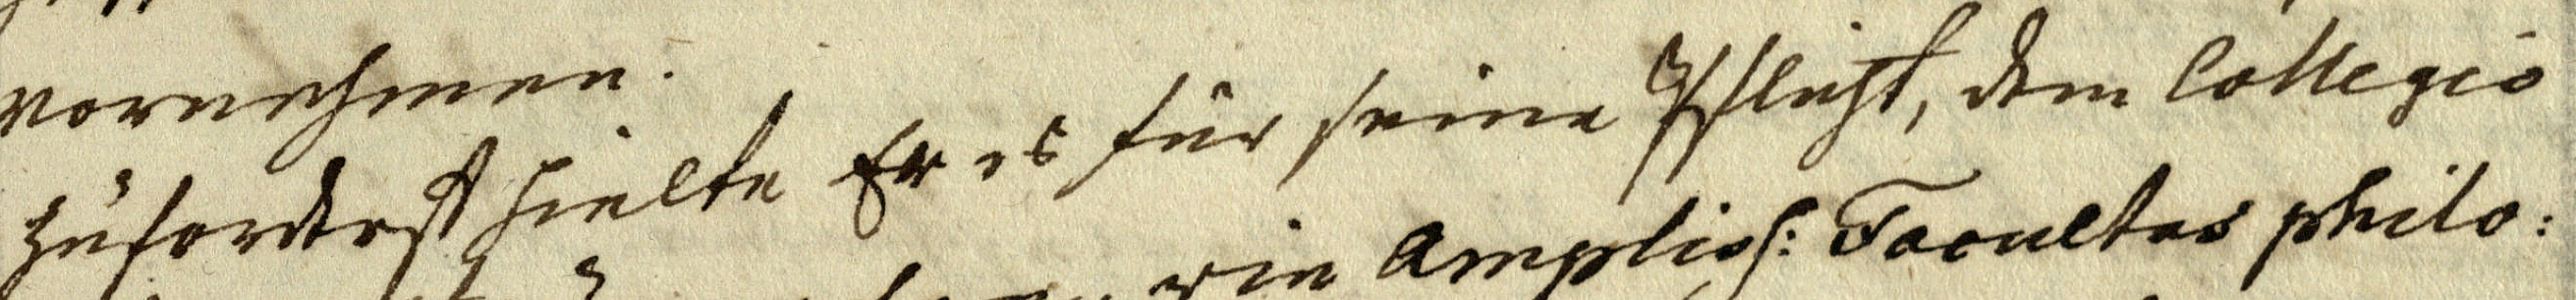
Zuförderst hielte Er es für seine Pflicht, dem Collegio
